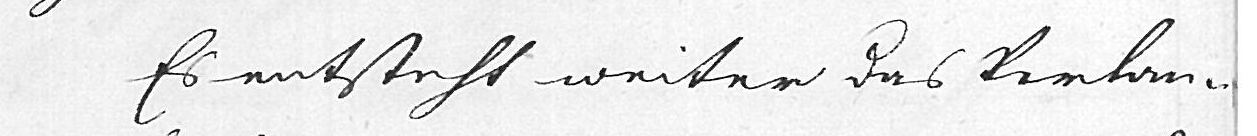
Es entsteht weiter das Verlan-
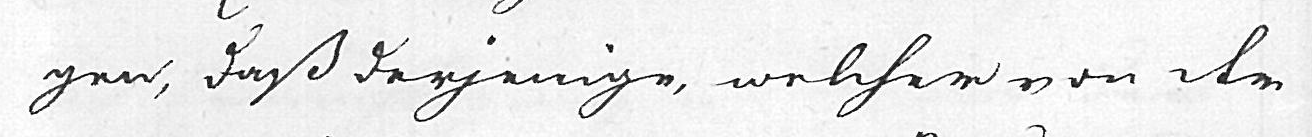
gen, daß derjenige, welcher von der
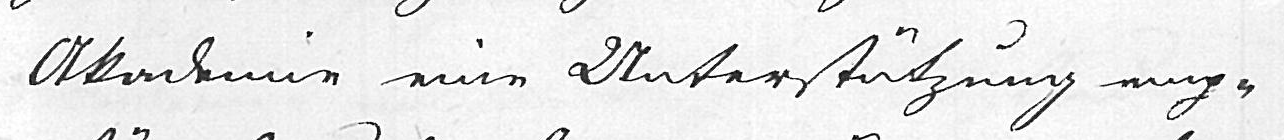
Akademie eine Unterstützung emp-
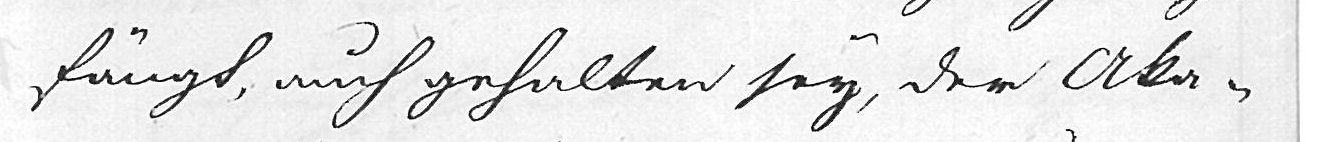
fängt, auch gehalten sey, der Aka-
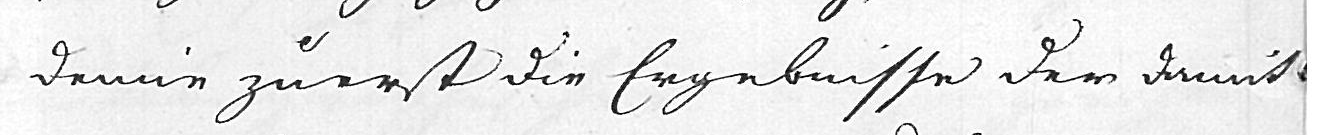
demie zuerst die Ergebisse der damit-
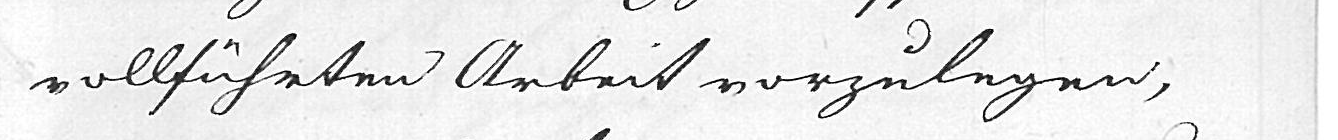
vollführten Arbeit vorzulegen,
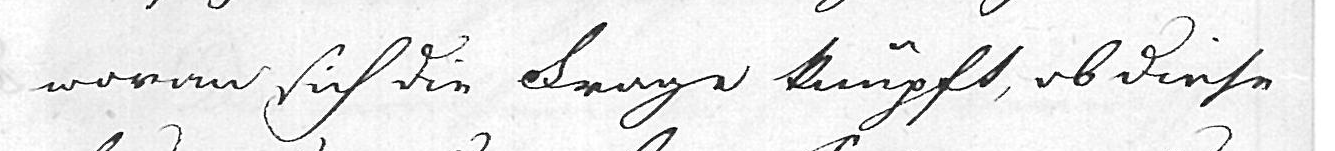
woran sich die Frage knüpft, ob diese
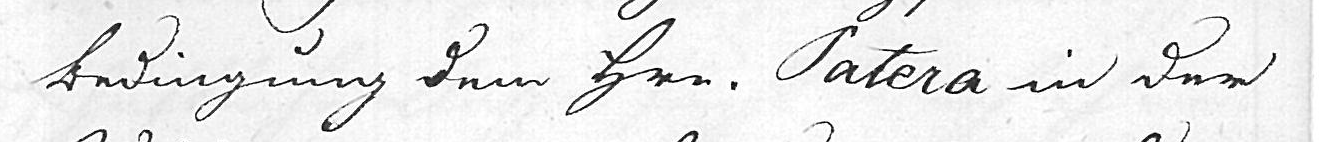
Bedingung dem Hrn. Patera in der
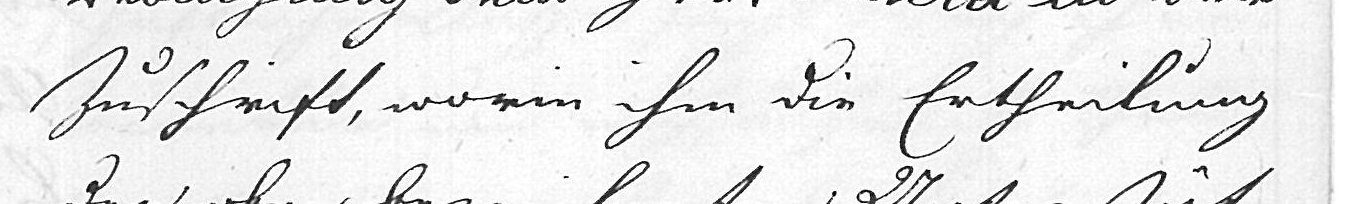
Zuschrift, worin ihm die Ertheilung
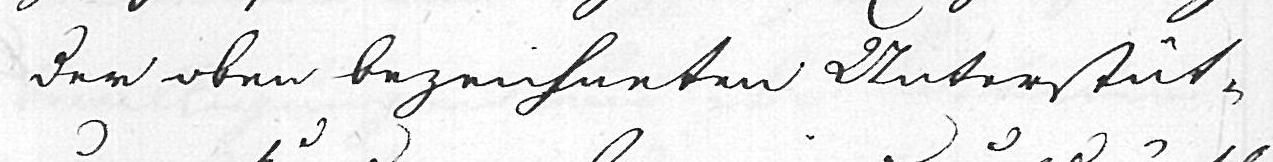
der oben bezeichneten Unterstüt-
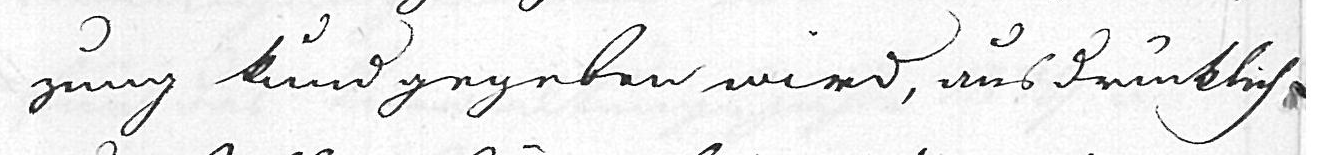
zung kundgegeben wird, ausdrücklich
